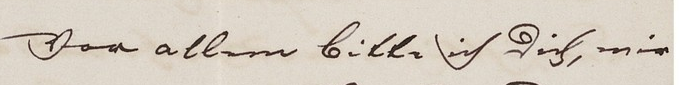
Vor allem bitte ich Dich, mir
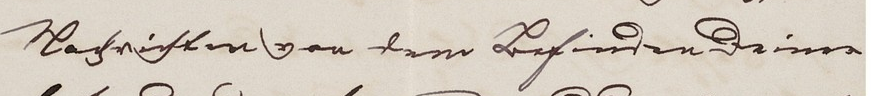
Nachrichten von dem Befinden Deiner
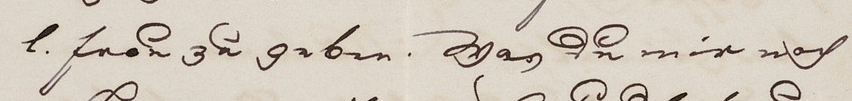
l. Frau zu geben. Was Du mir noch
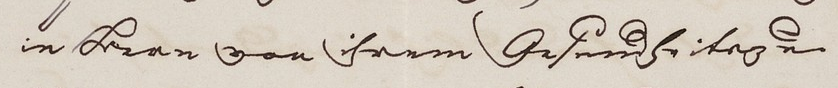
in Bern von ihrem Gesundheitszu-
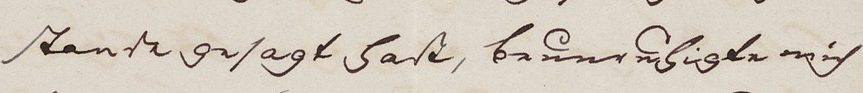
stande gesagt hast, beunruhigte mich
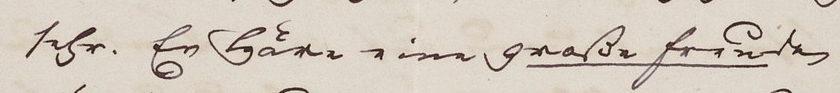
sehr. Es wäre eine große Freude
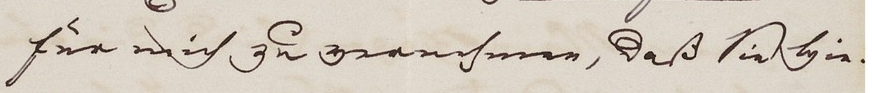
für mich zu vernehmen, daß Sie wie-
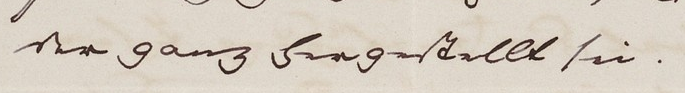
der ganz hergestellt sei.
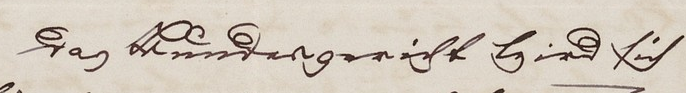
Das Bundesgericht wird sich
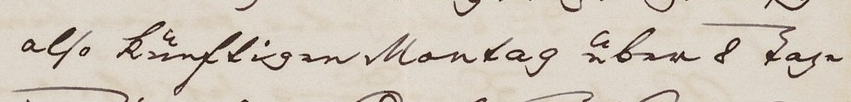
also künftigen Montag über 8 Tage
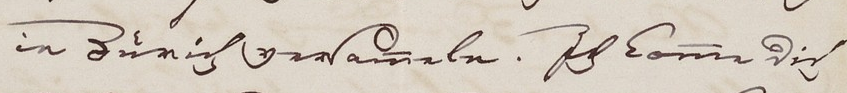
in Zürich versammeln. Ich komme Dich
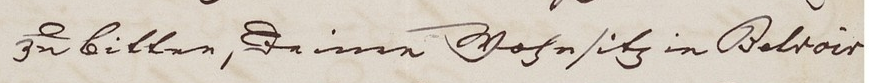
zu bitten, Deinen Wohnsitz in Belvoir
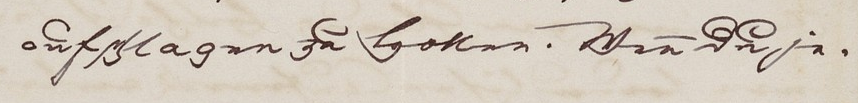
aufschlagen zu wollen Wenn Du je-
